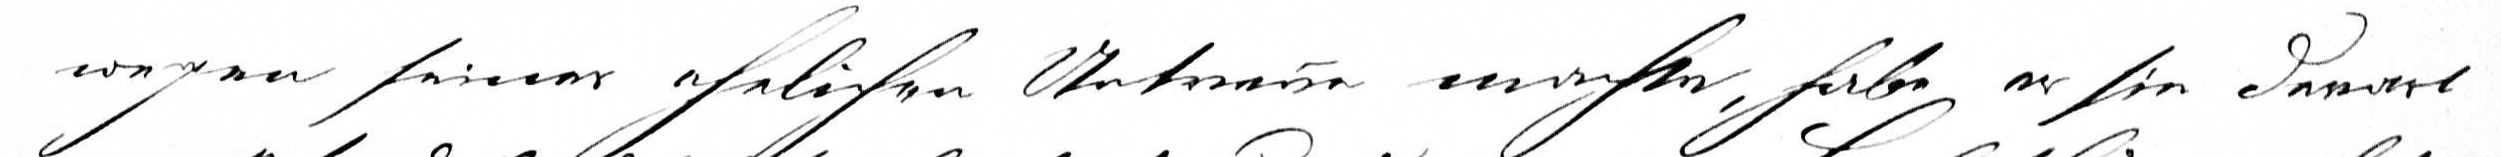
wegen seiner ehelichen Untreue machte, habe er sie derart
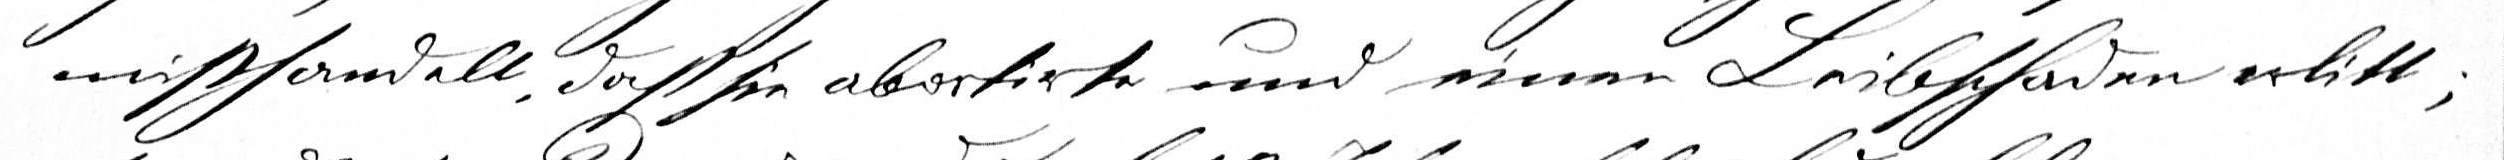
mißhandelt, daß sie abortirte und einen Leibschaden erlitt;
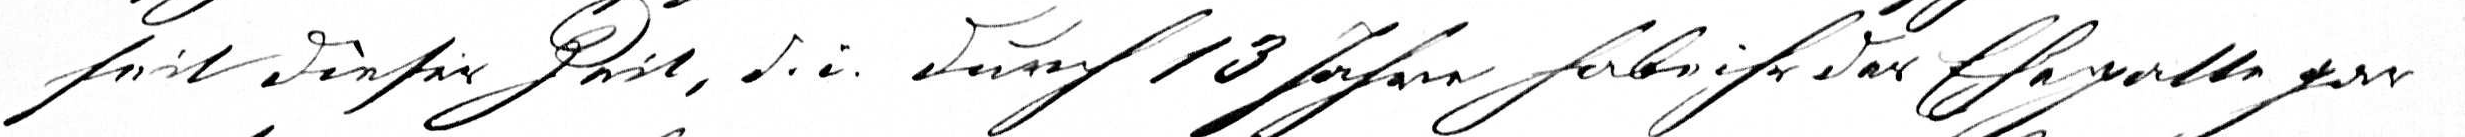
seit dieser Zeit, d.i. durch 13 Jahren habe ihr der Ehegatte gar
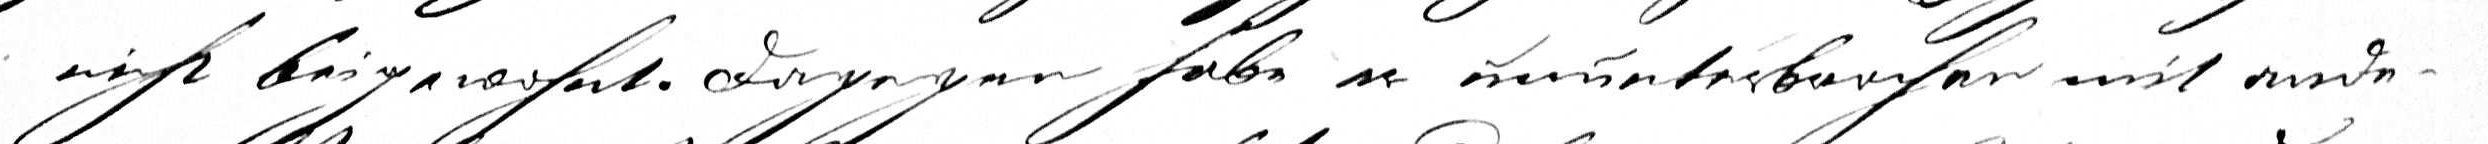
nicht beigewohnt. Dagegen habe er ununterbrochen mit ande¬
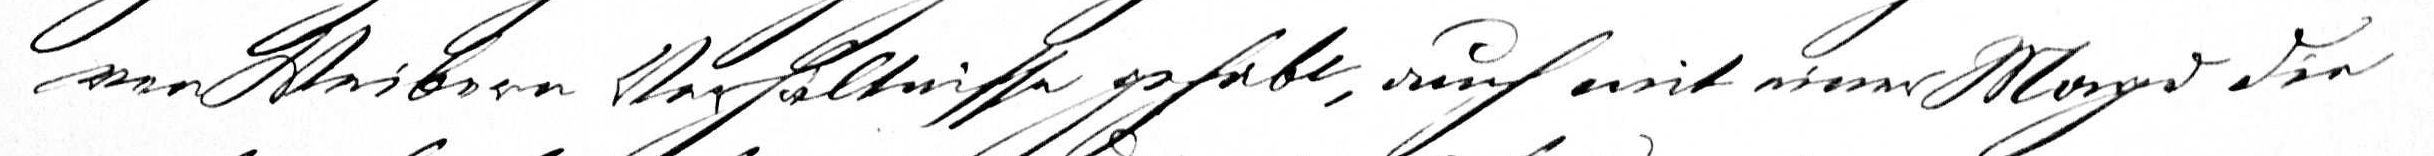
ren Weibern Verhältnisse gehabt, auch mit einer Magd die
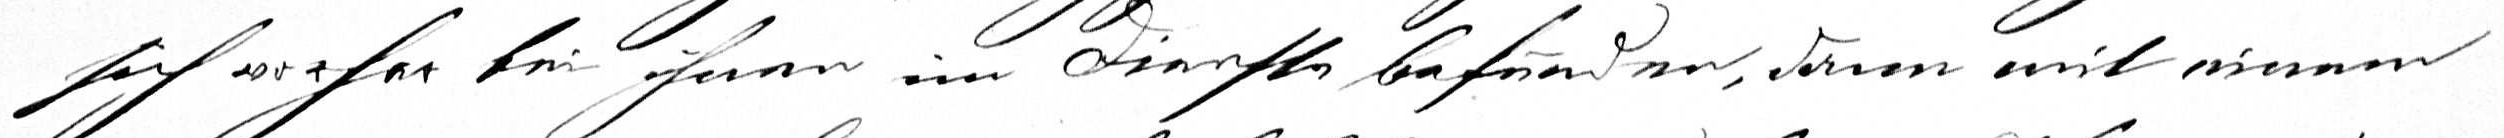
sich vorher bei ihnen im Dienste befunden, dann mit einem
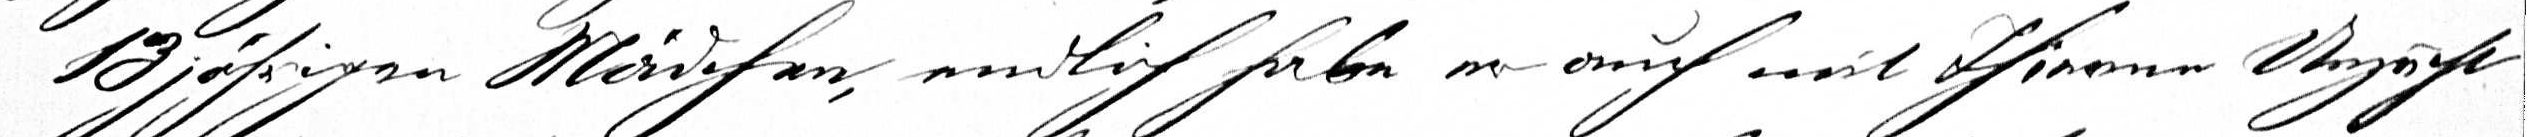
13jährigen Mädchen, endlich habe er auch mit Thieren Unzucht
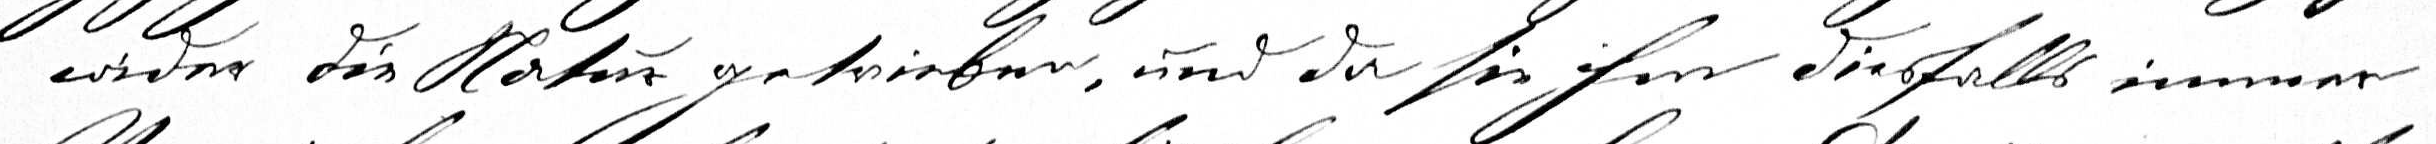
wider die Natur getrieben, und da sie ihm diesfalls immer
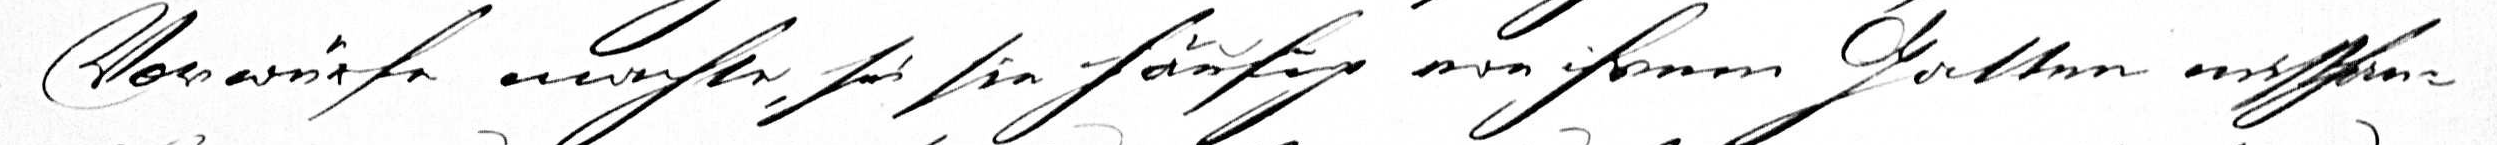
Vorwürfe machte, sei sie häufig von ihrem Gatten mißhan¬
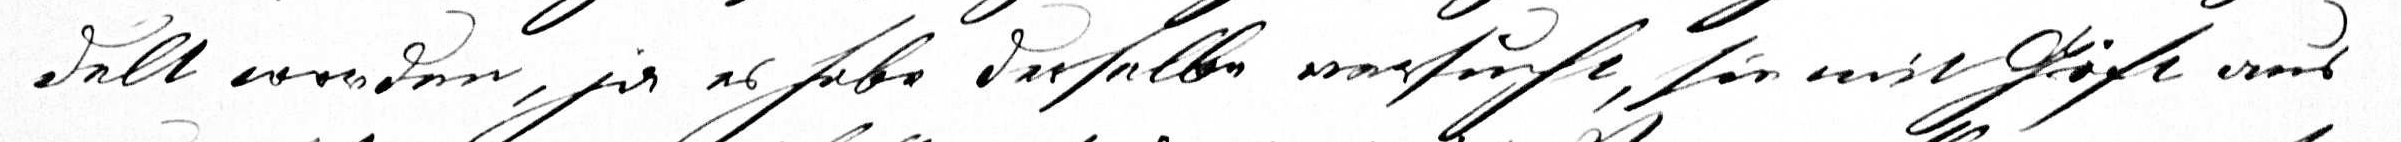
delt worden, ja es habe derselbe versucht, sie mit Gift aus
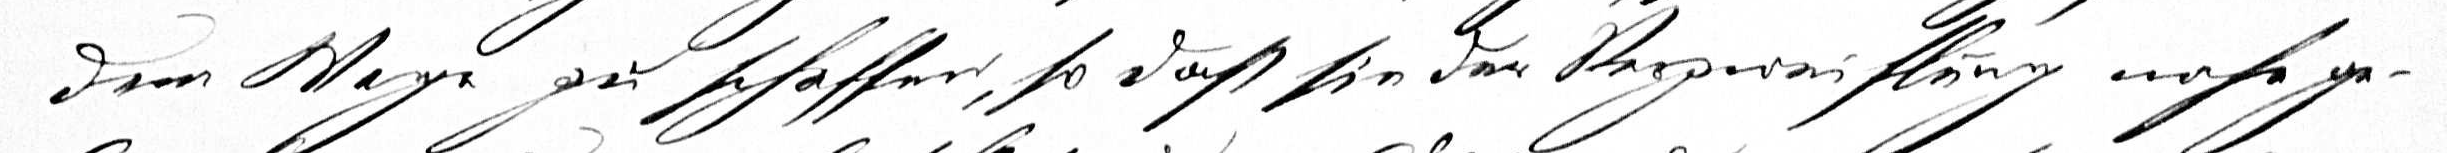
dem Wege zu schaffen, so daß sie der Verzweiflung nah ge¬
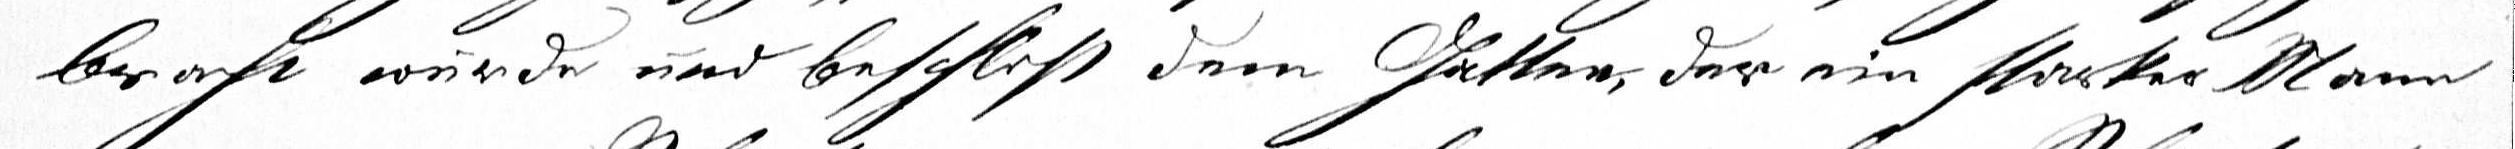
bracht würde und beschloß dem Gatten, der ein starker Mann
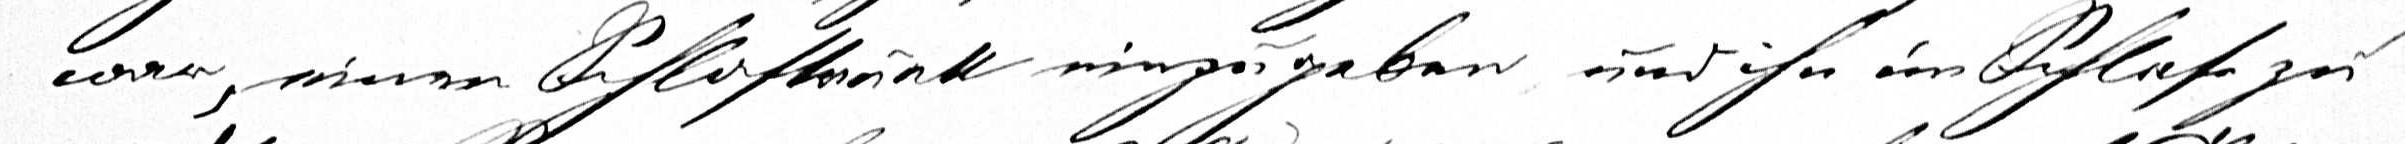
war, einen Schlaftrank einzugeben und ihn im Schlafe zu
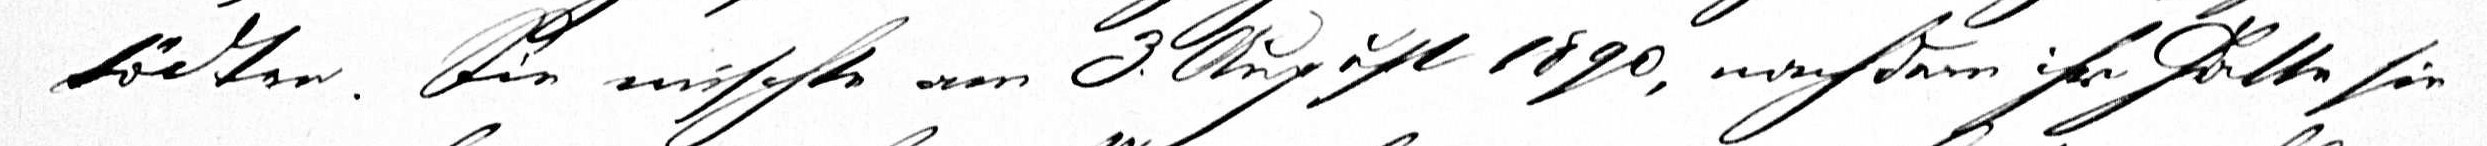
tödten. Sie mischte am 3. August 1890, nachdem ihr Gatte sie
